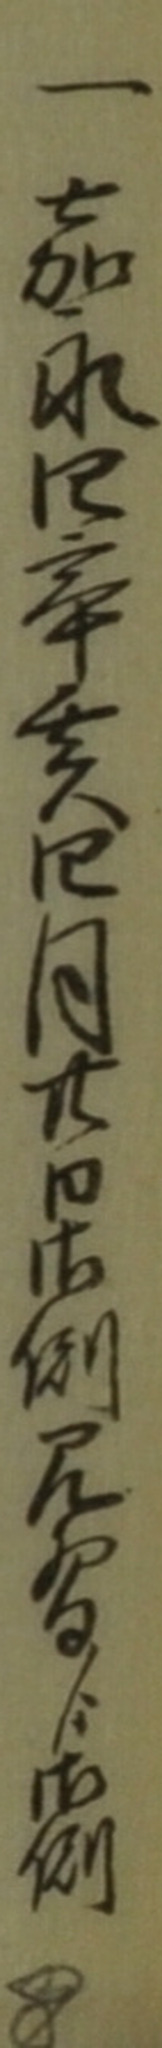一嘉永四辛亥四月廿日御側見習ゟ御側
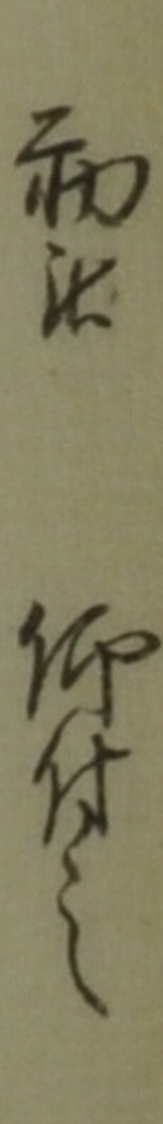勤被仰付之
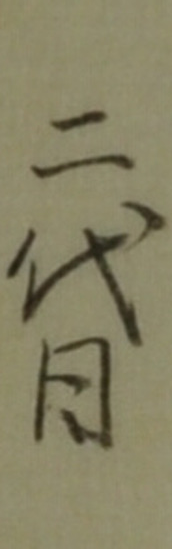二代目
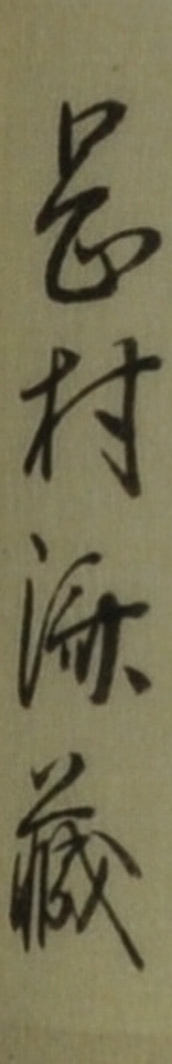岡村済蔵

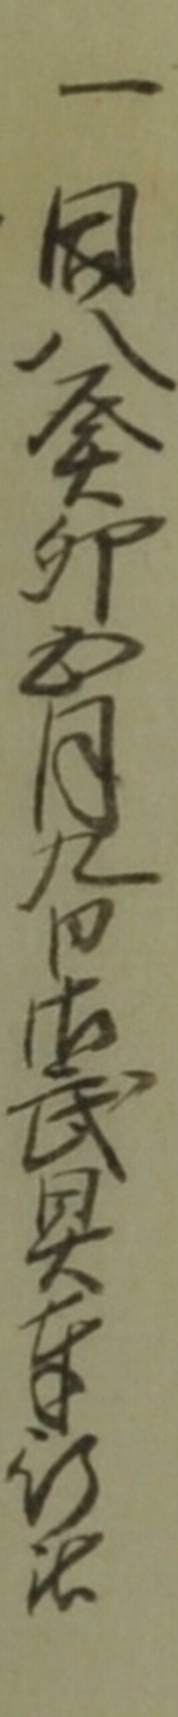一同八癸卯五月九日御武具奉行被
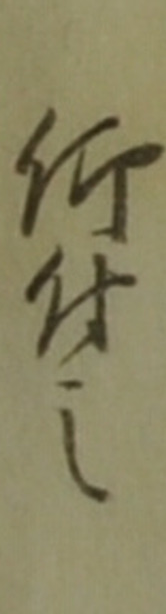仰付之
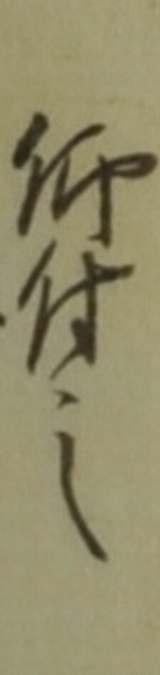仰付之
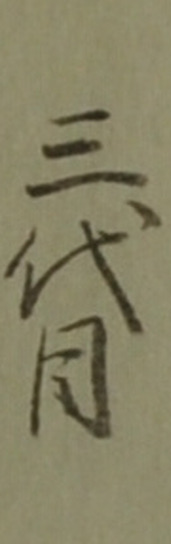三代目
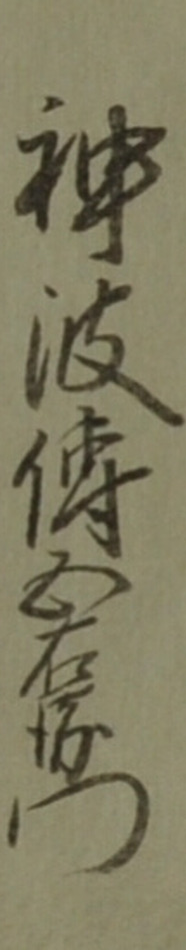神波伝五右衛門
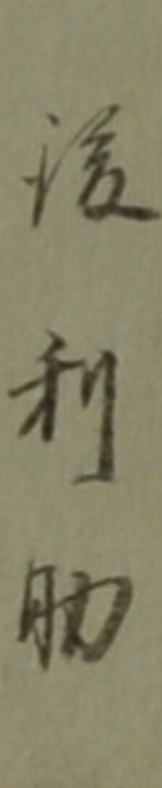後利助
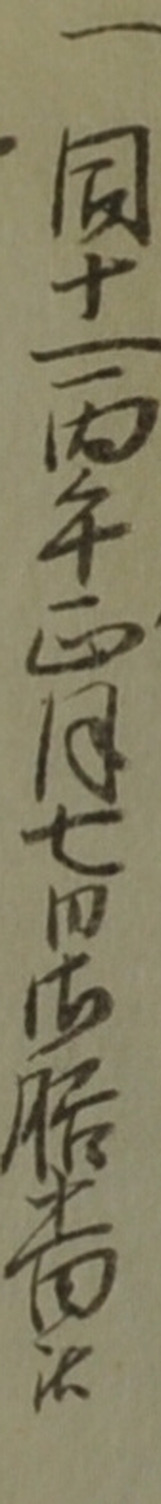一同十一丙午正月七日御膳番被
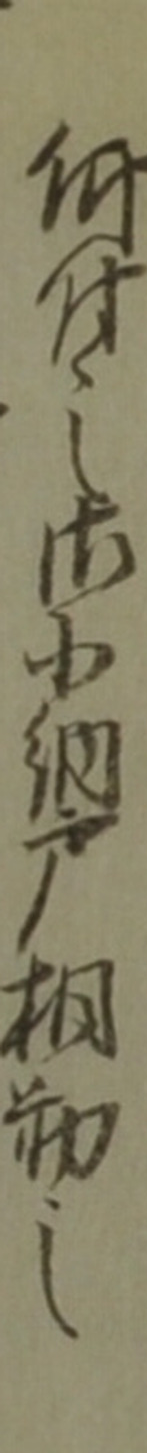仰付之御小納戸相勤之
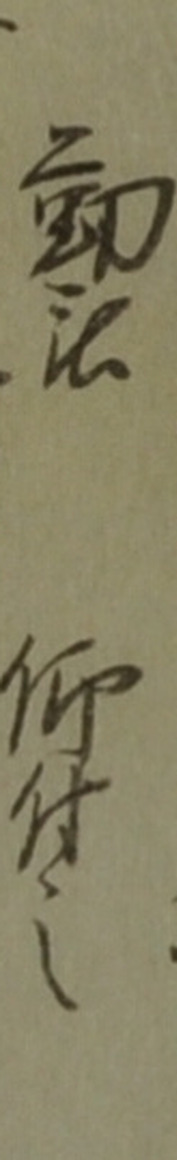勤被仰付之
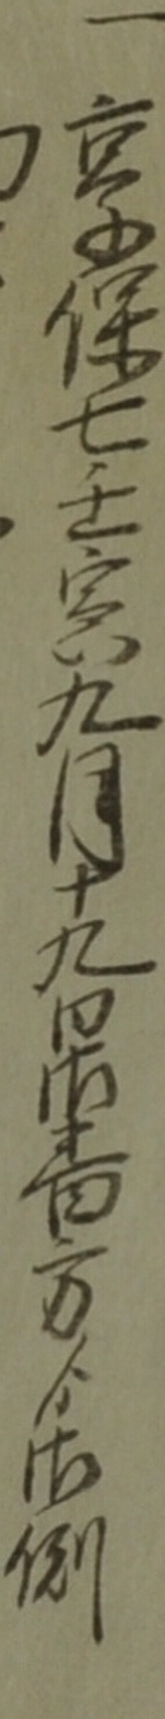一享保七壬寅九月十九日御番方ゟ御側
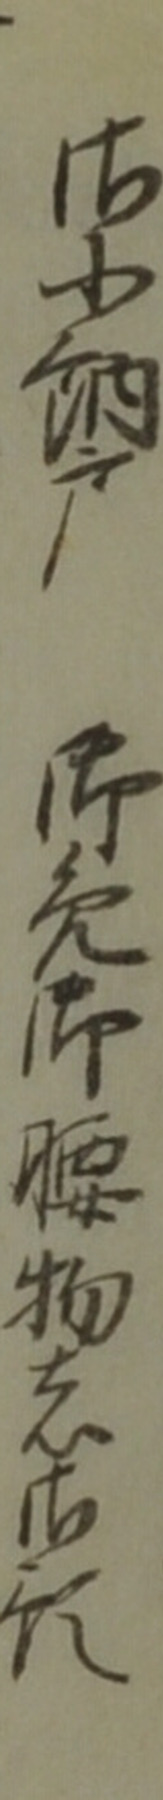御小納戸御免御腰物者御預
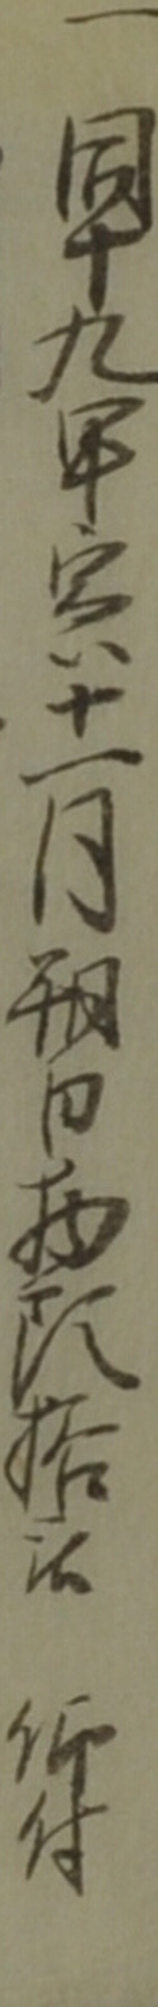一同十九甲寅十一月朔日物頭格被仰付
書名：諸御役代々録（五）
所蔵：伊那市立高遠町図書館・合同会社AMANE
